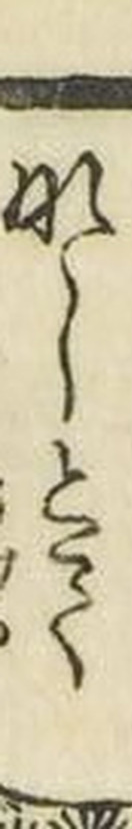なしとて
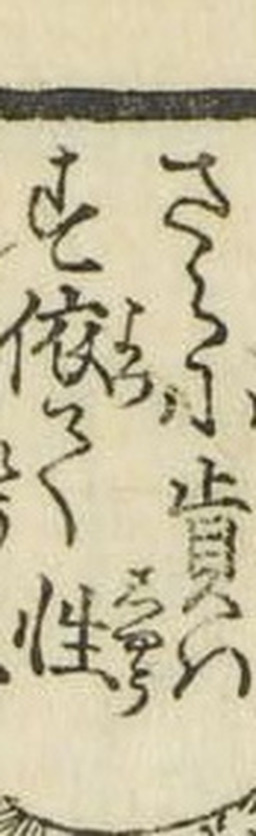す依て性
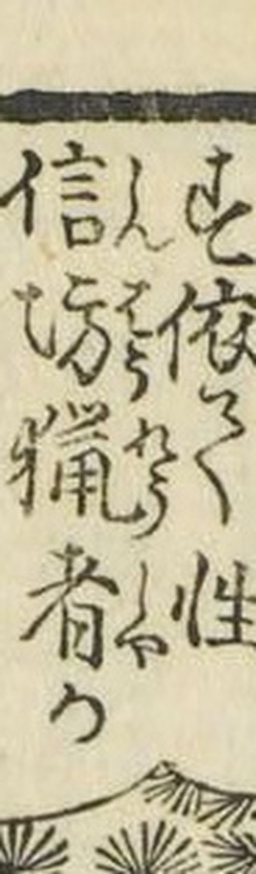信坊猟者か
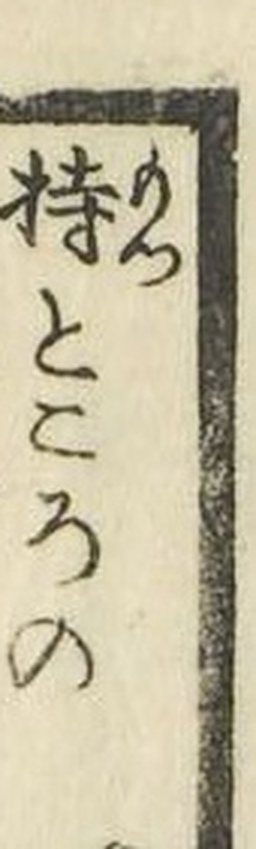持ところの
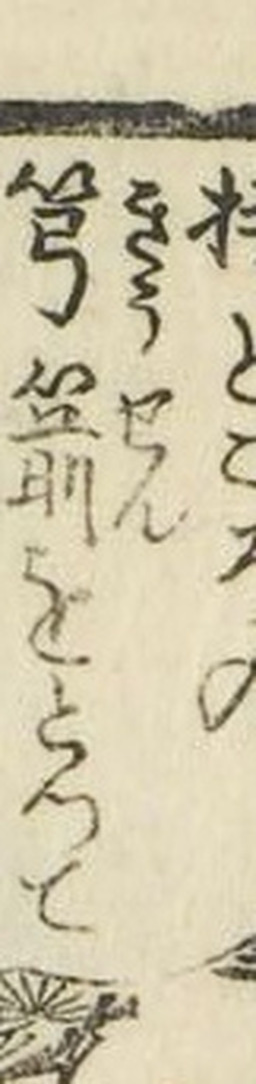弓箭をとつて
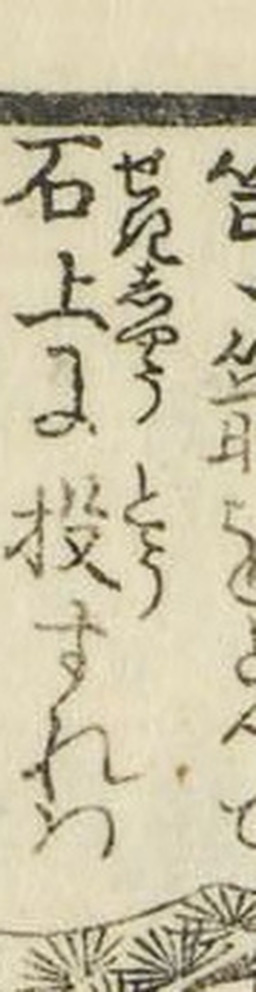石上に投すれは
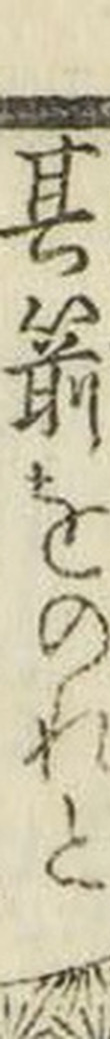其箭をのれと
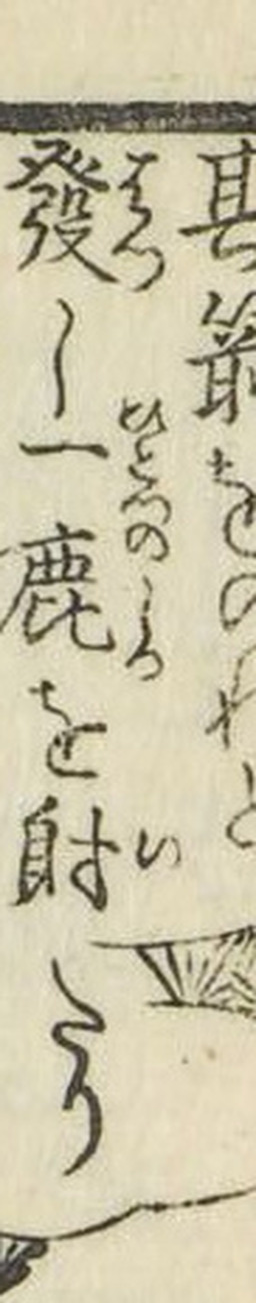発し一鹿を射たり
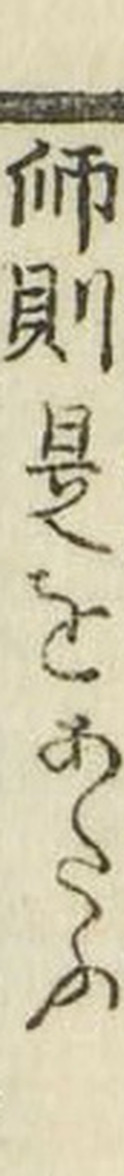師則是をあたふ
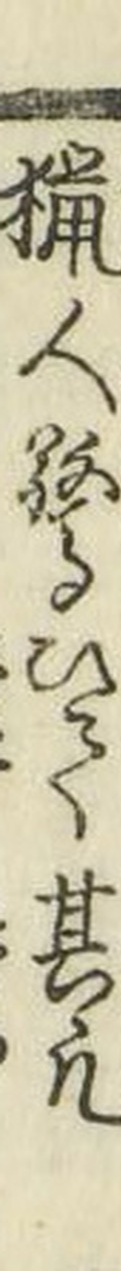猟人驚ひて其凡
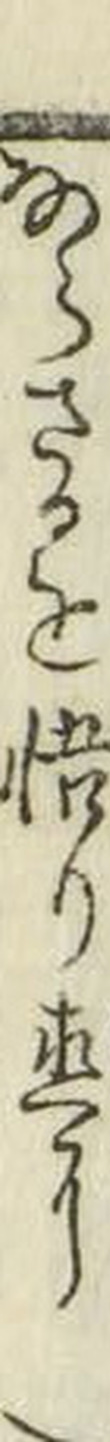ならさるを悟り直に
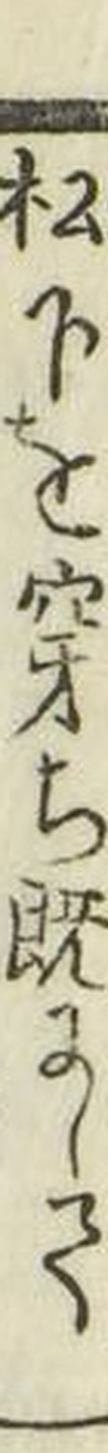松下を穿ち既にして
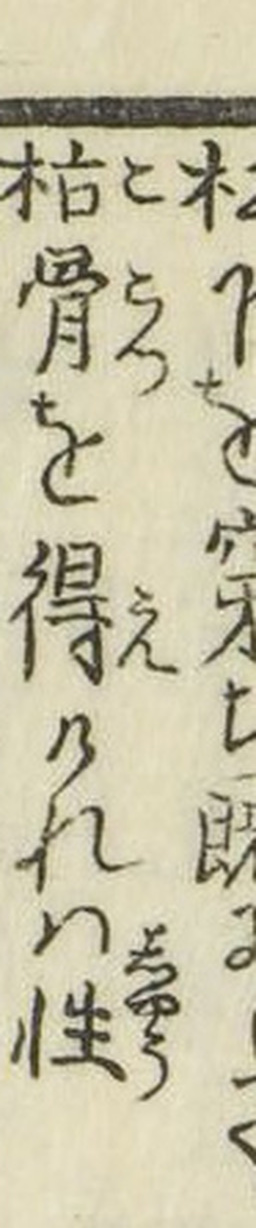枯骨を得けれは性
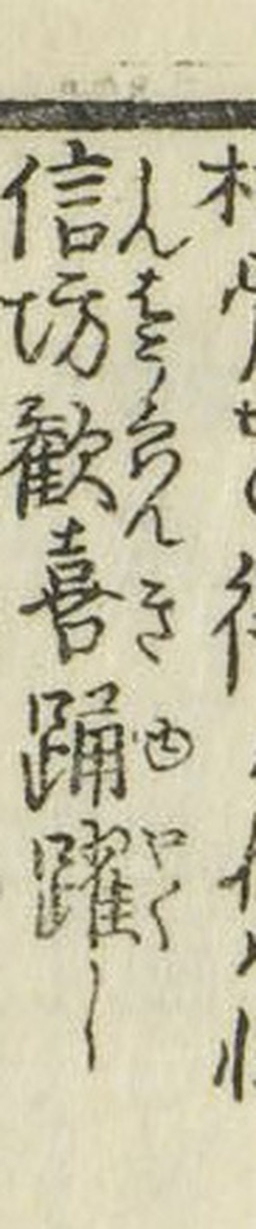信坊歓喜踊躍し
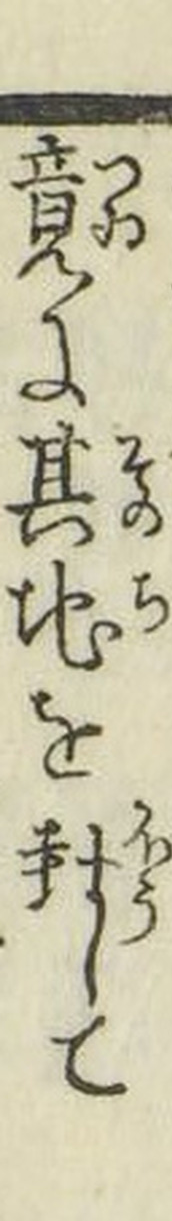竟に其地を封して
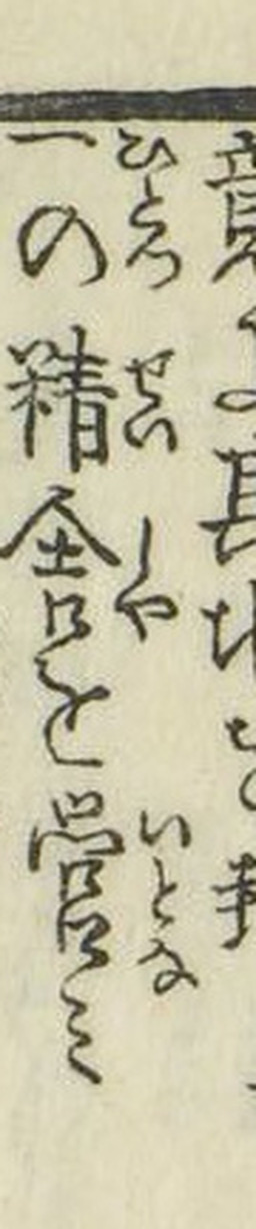一の精舎を営み
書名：江戸名所図会 20巻 巻之16
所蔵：東京学芸大学教育コンテンツアーカイブ
